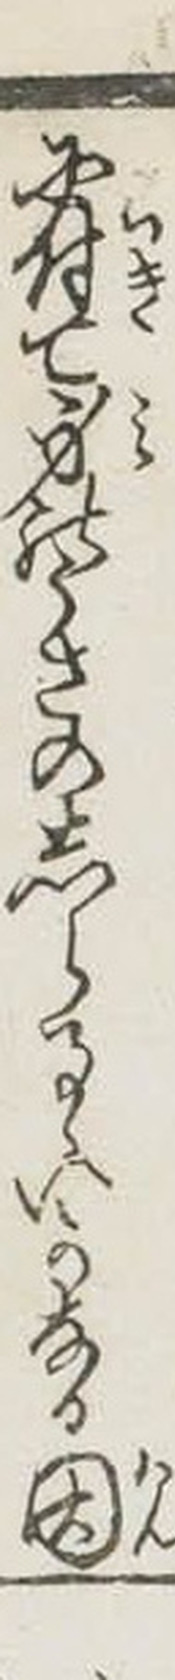に付て身のうさのしらるゝいかなる因
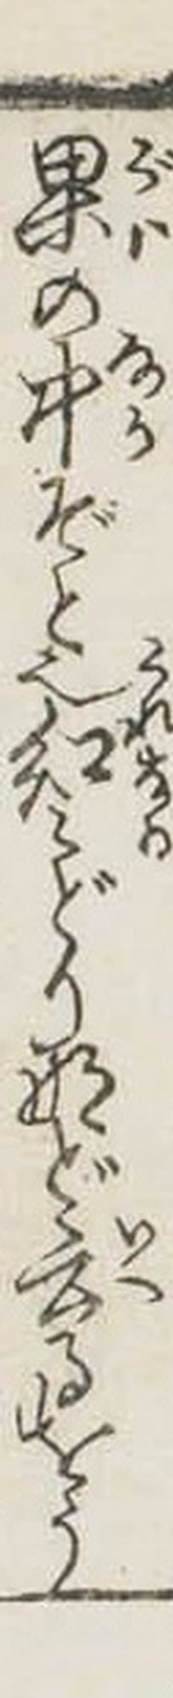果の中ぞと也紅みどりなど云るをう
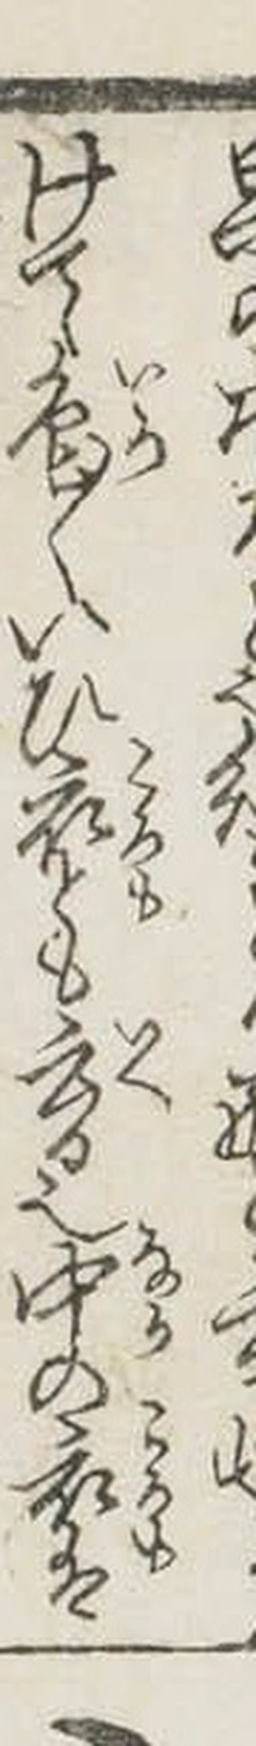けて色々いひ衣とも云る也中の衣は
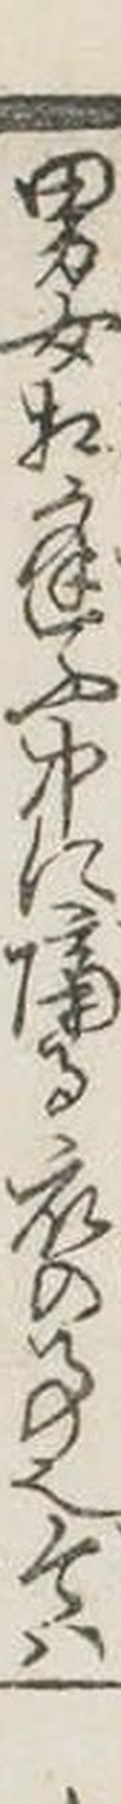男女相逢ふ中に隔る衣の事也今は
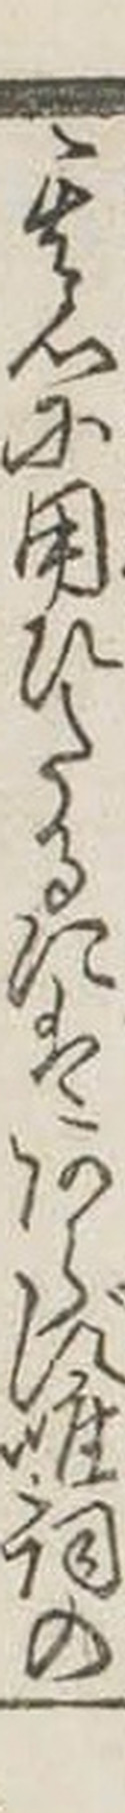其心に用ひたるにはあらず唯詞の
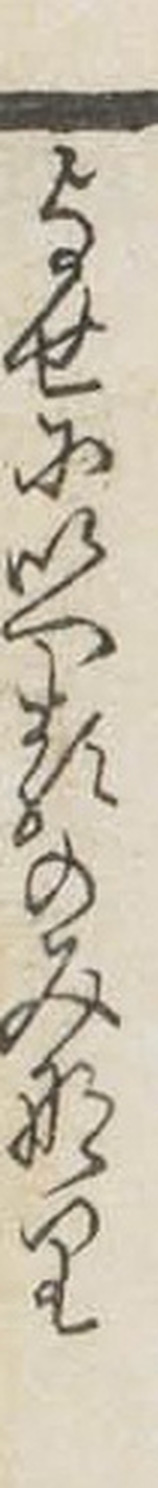よせにいへるのみなり

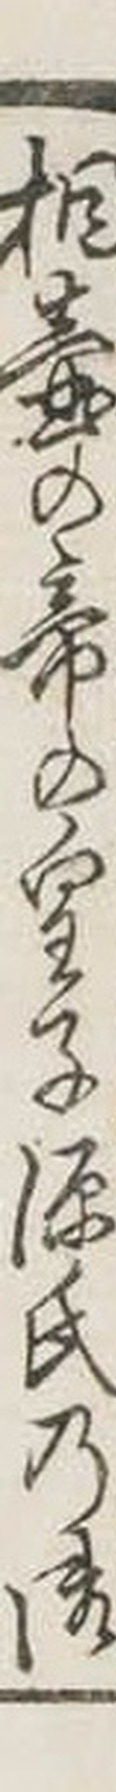桐壺の帝の皇子源氏の御
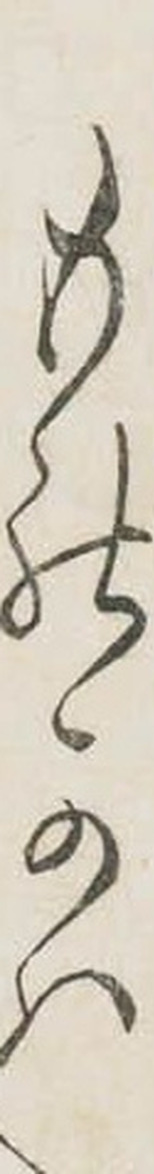ものかは
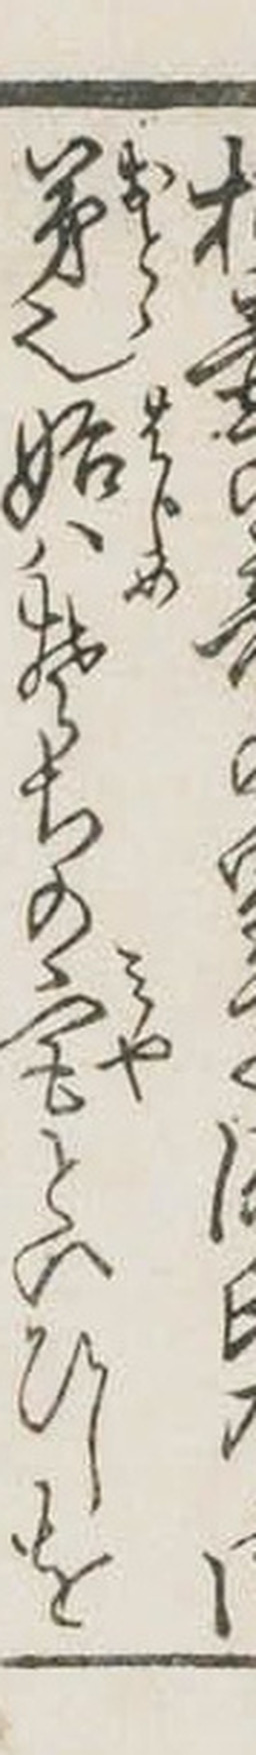弟也始はそちの宮といひしを
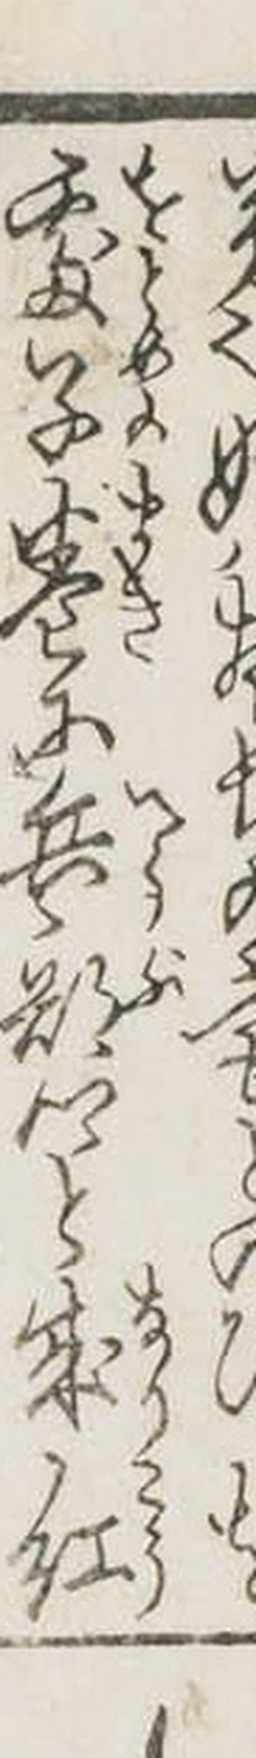処子巻に兵部卿と成紅
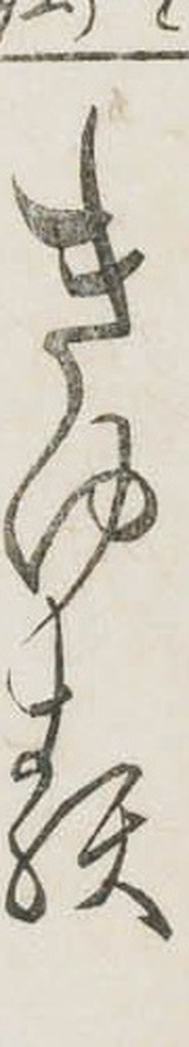きゆる
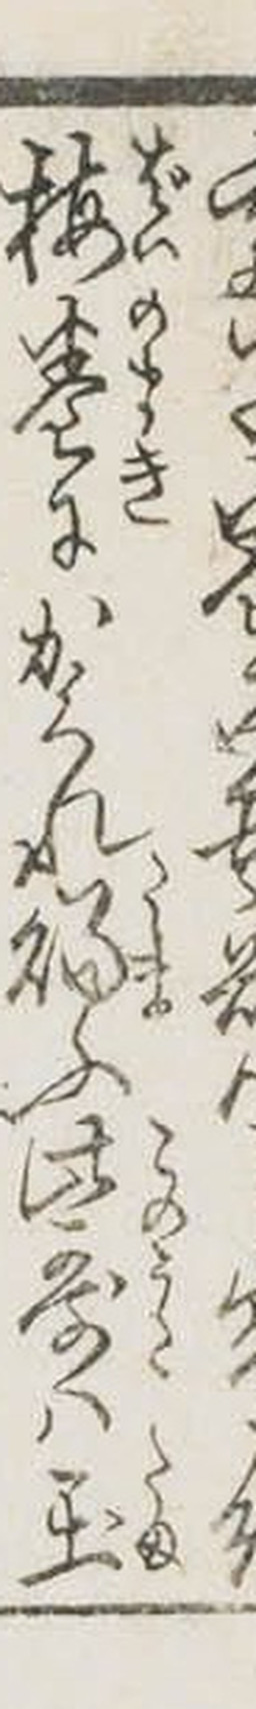梅巻にかくれ賜ふ此哥は玉
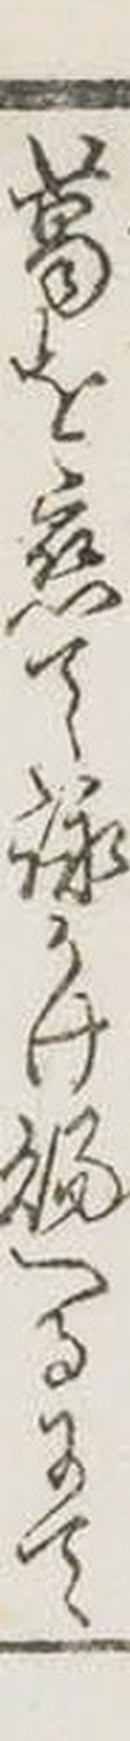葛を恋て詠かけ賜へるにて
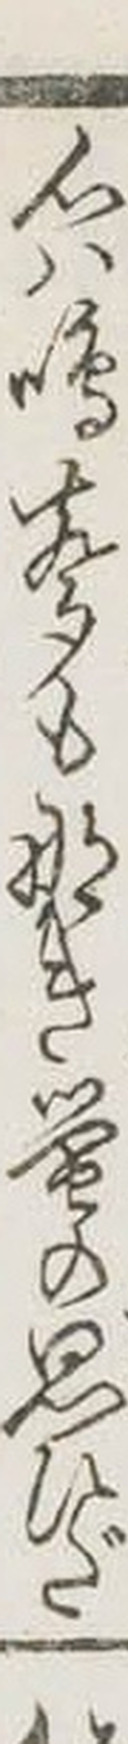心は鳴声もなき蛍の思ひだ
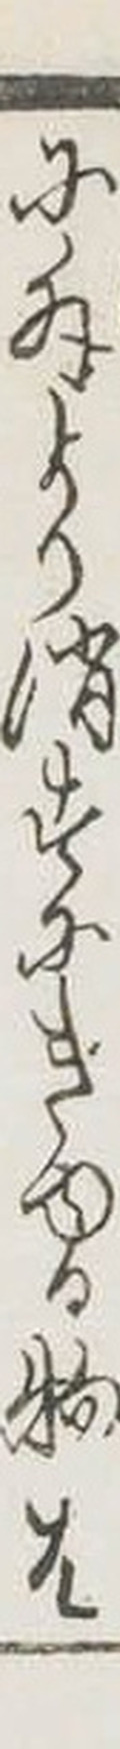に外より消すにきゆる物は
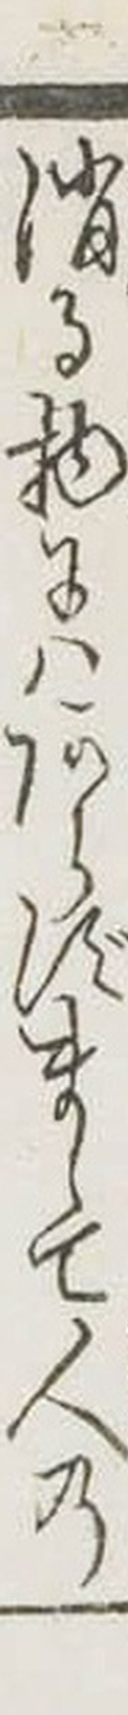消る物にはあらずまして人の
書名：源氏百人一首
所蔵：東京学芸大学教育コンテンツアーカイブ
